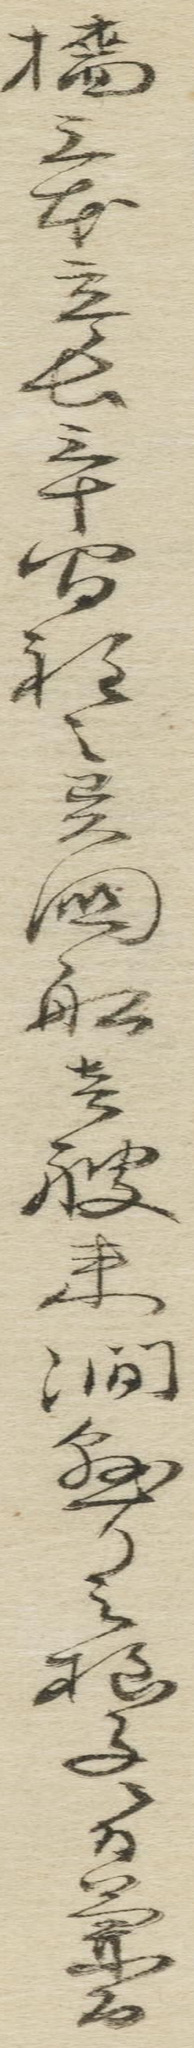檣三本立長三十間程之異国船壱艘参僩懸り之様子二付兼而
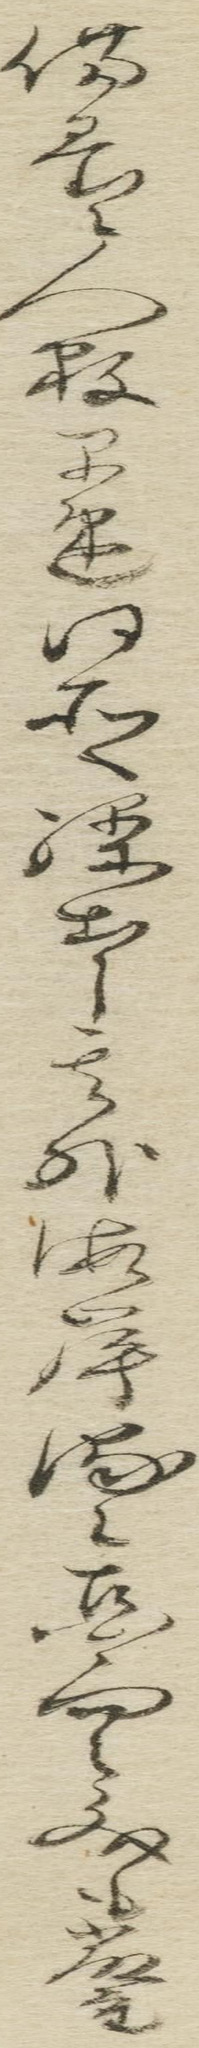備置候人数早速同所へ繰出し其外海岸浦々固候向之処も厳重
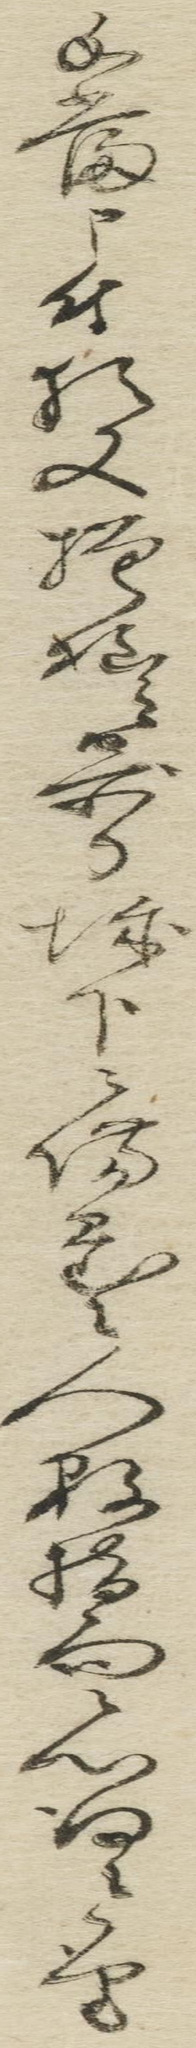手当申付猶又纏様二付残り城下二備置候人数指向候心得二御座候
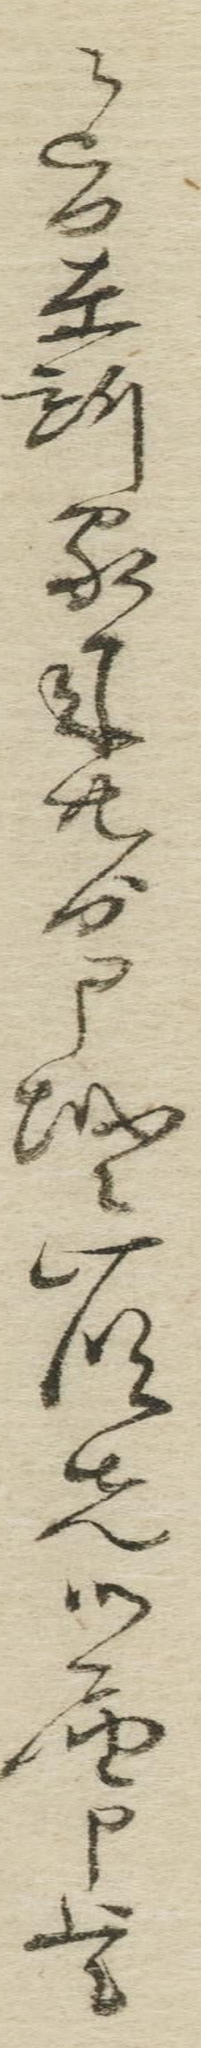之旨在所家来共ゟ申越候此段先御届申上候
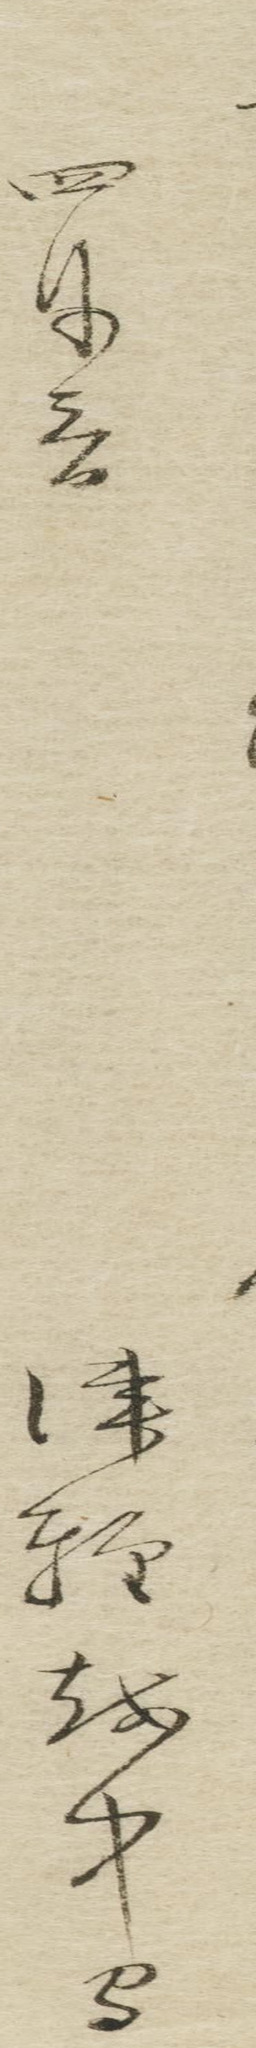四月三日津軽越中守

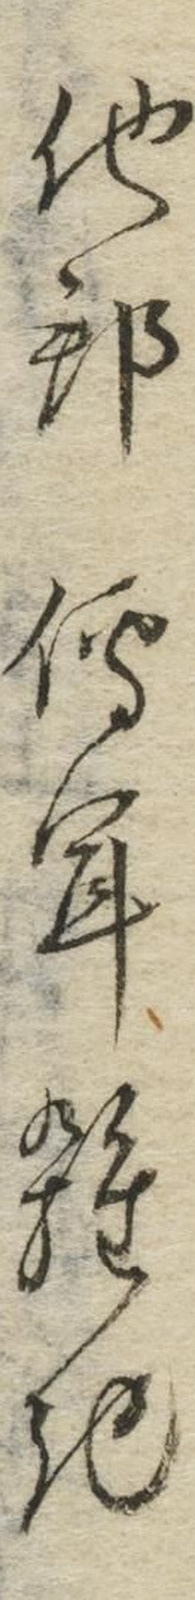他邨伝聞雑記
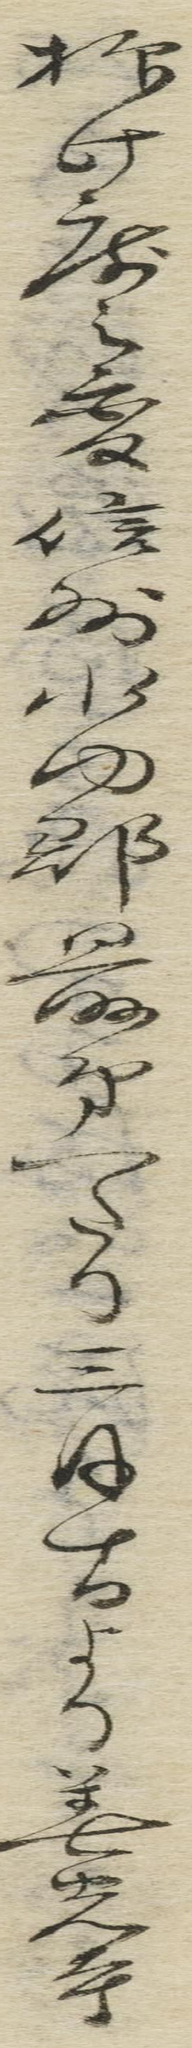抑此度之変信州水内郡最第一たり三月十日より善光寺
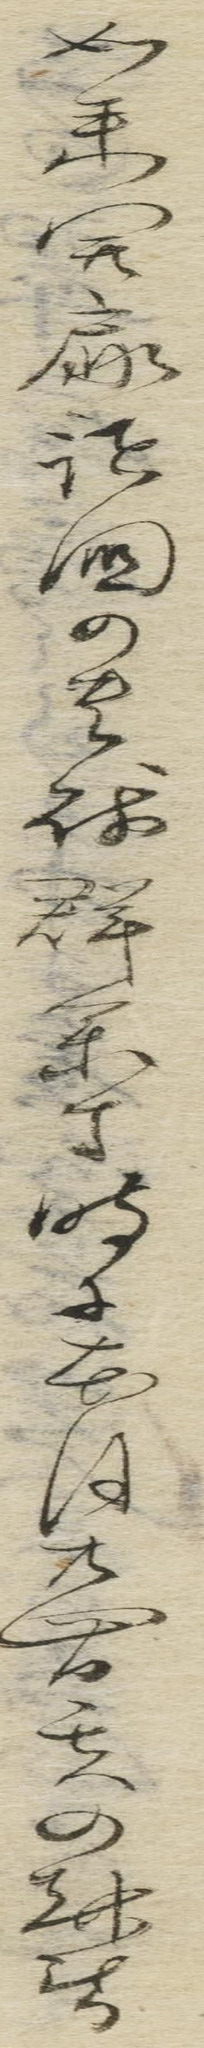如来開扉諸国の貴賤群集す時に本月廿四日亥の刻計り
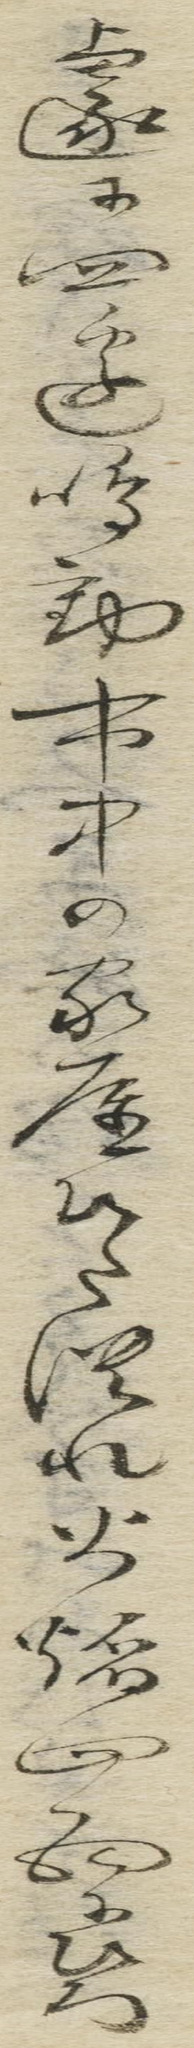占逐に四辺鳴動市中の家屋ひた潰れ火焔四面にひろ
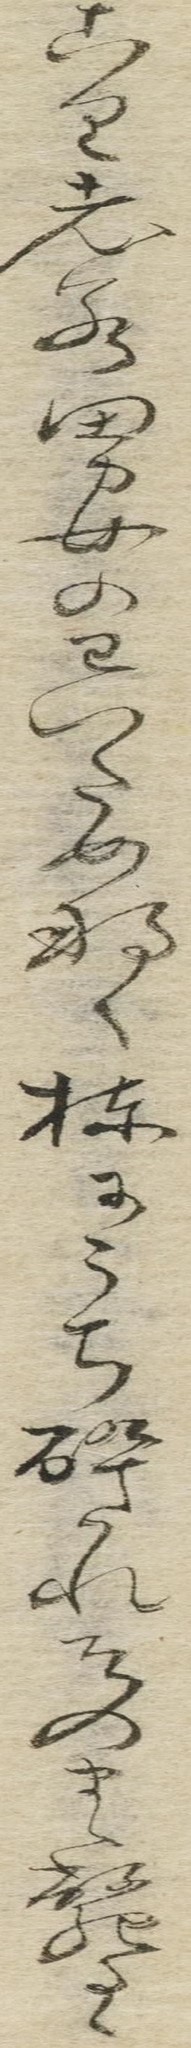こり老若男女のわつためなく棟にうち砕かれそのまゝ斃る
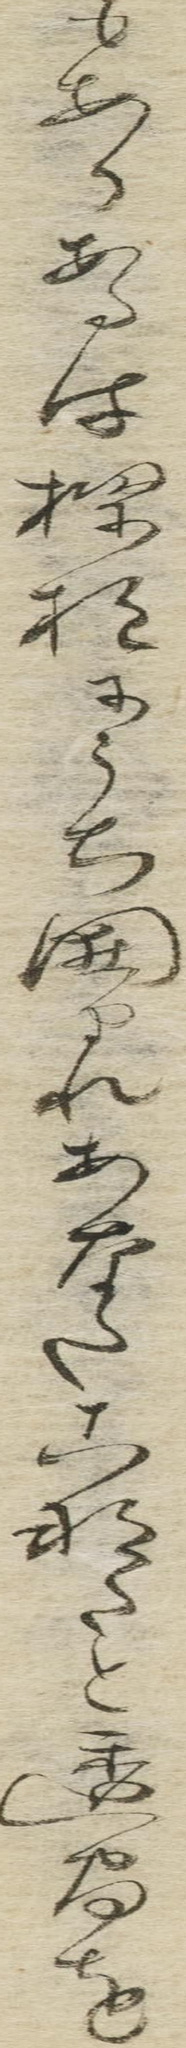もありあるは樑柱にうち囲まれあなたこなたと透間を
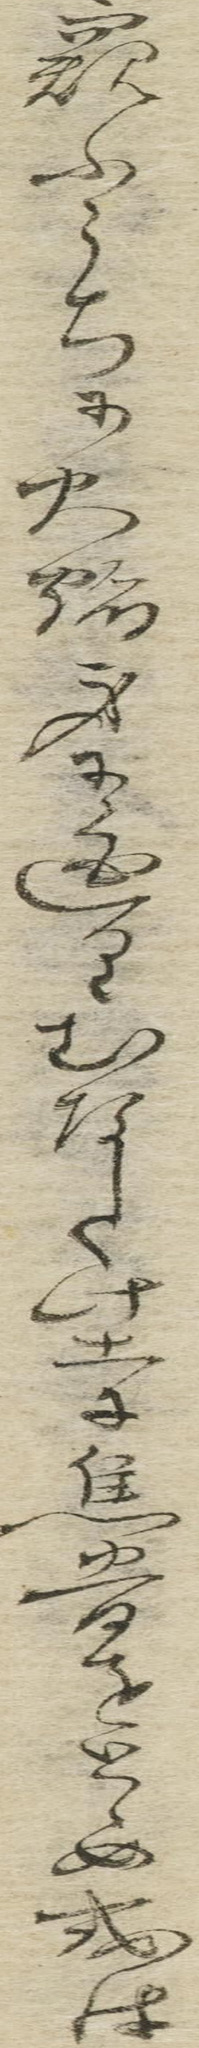窺ふうちに火焔身に迫りむなしく此土に焦骨をとゝめ或は
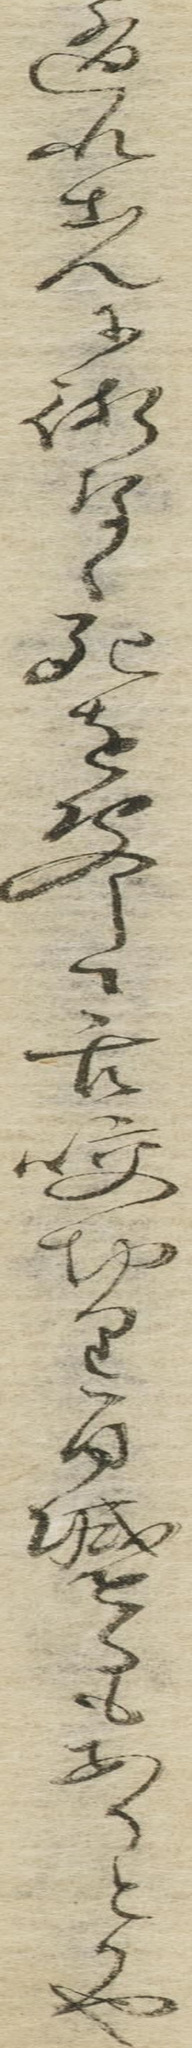遁れ出んに術なく死を決して舌咬切自滅をるもありとりや
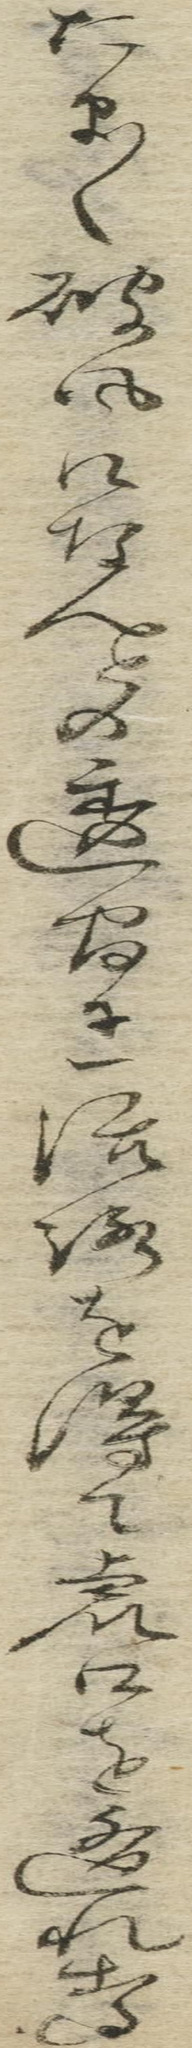たま〳〵破風口なんとの透間に一活路を得て虎口を遁れでるも

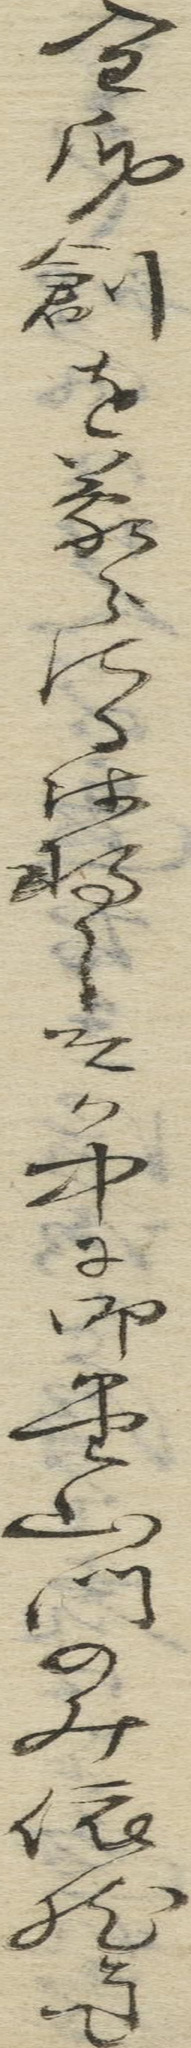全身創を蒙らけるは軽しそか中に御堂山門のみ依然として
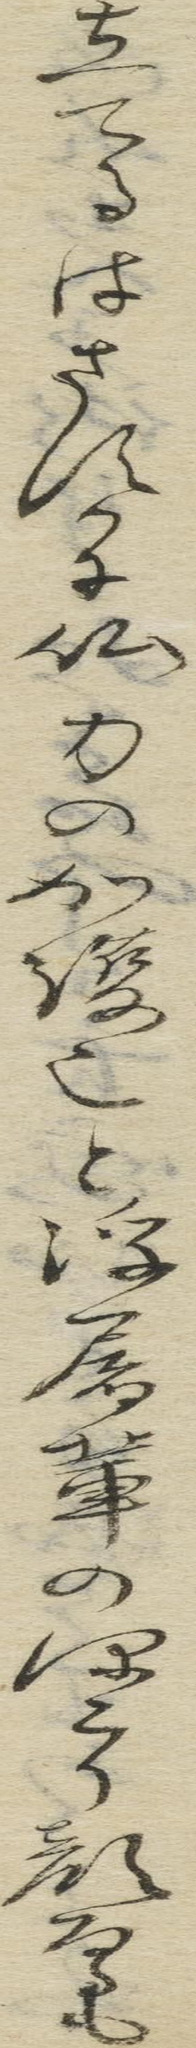立てるはさすかに仏力の加護也と浮屠輩のほこり願なるも
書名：弘化丁未天變日記
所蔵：東京大学地震研究所図書室 Earthquake Research Institute Library, The University of Tokyo, JAPAN
